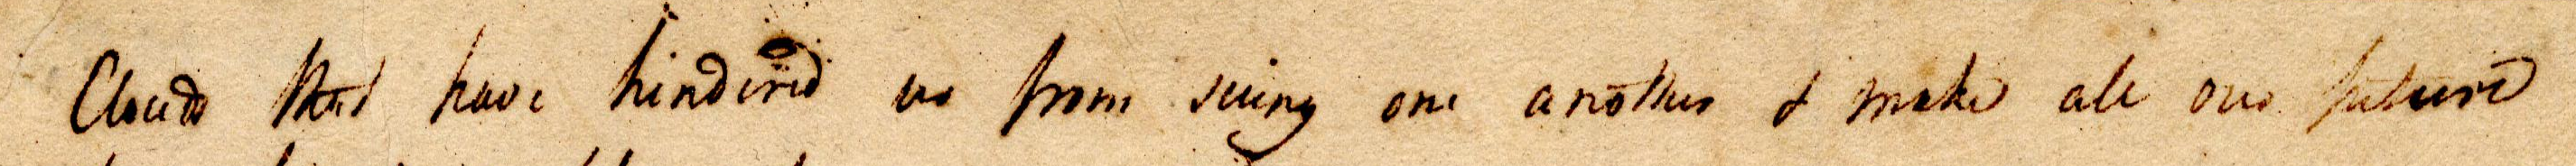Cloud that have hinder'd us from seeing on another & make all our future
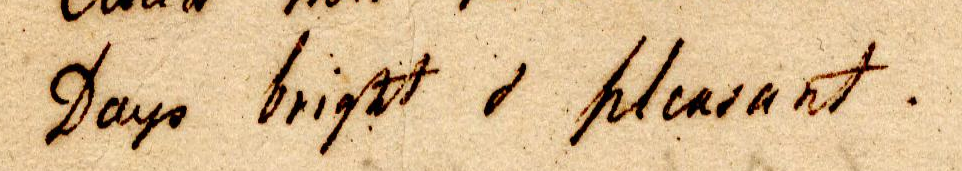Days bright & pleasant.
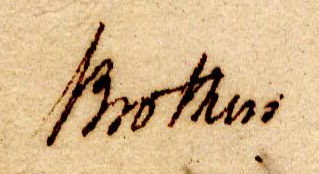Brothers
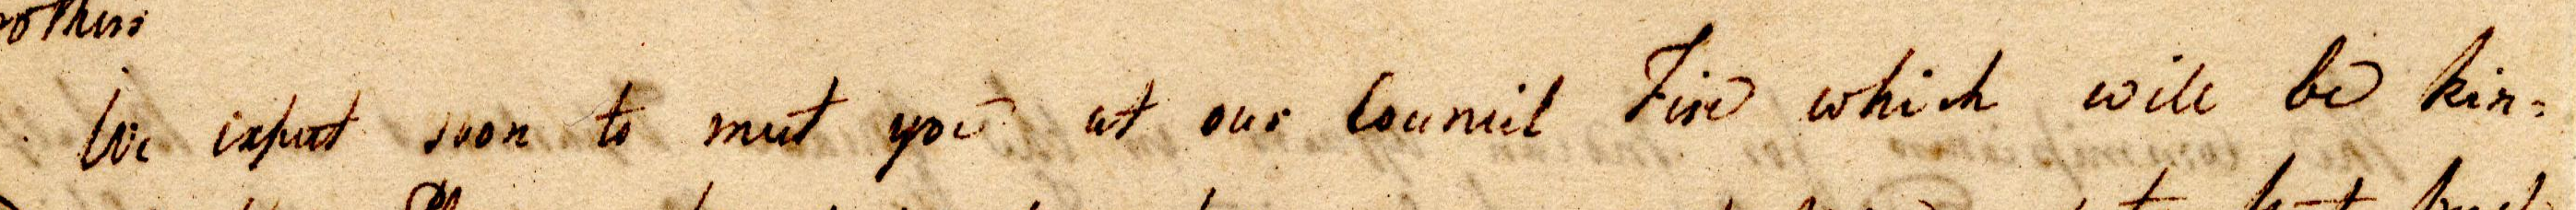We expect soon to meet you at our Council Fire which will be kin-
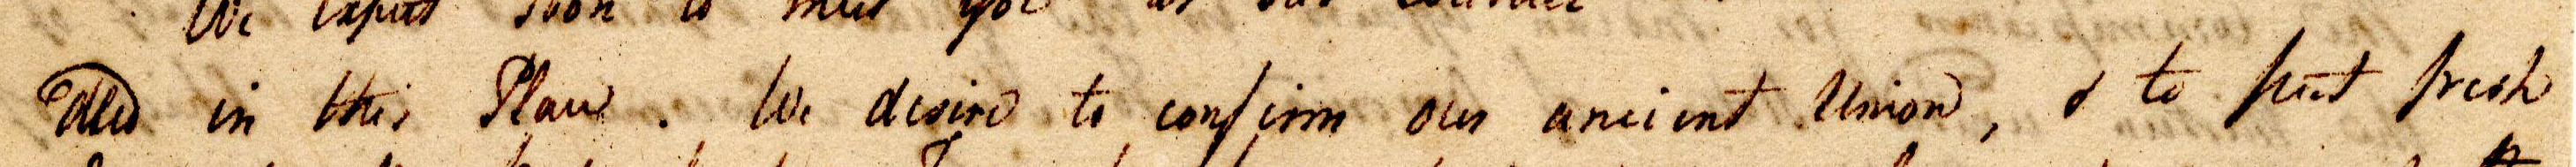dled in this Place. We desire to confirm our ancient Union, & to put fresh
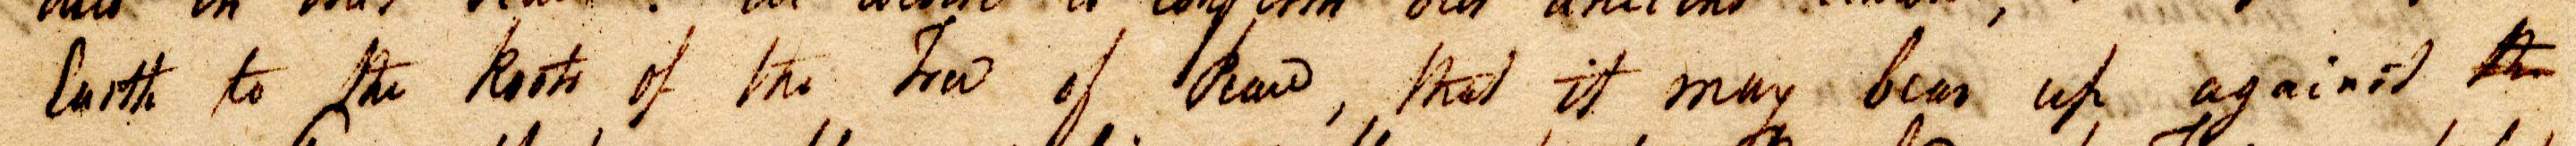Earth to the Roots of the Tree of Peace, that it may bear up against the
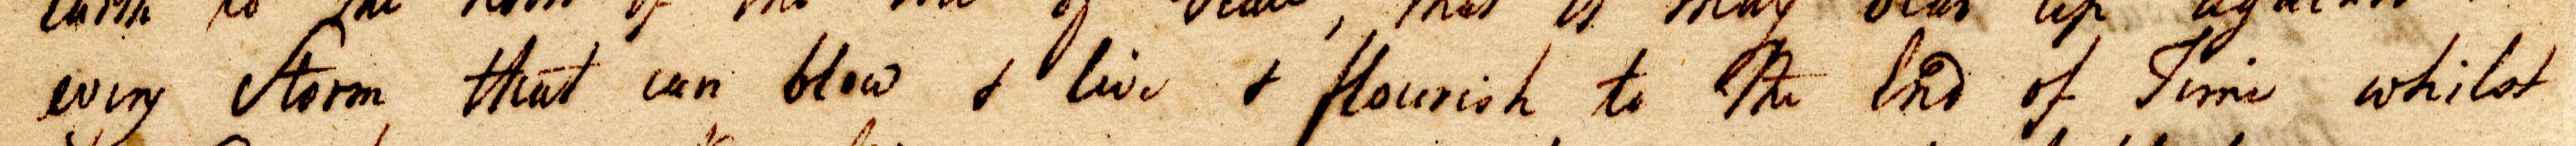every Storm that can blow & live & flourish to the End of Time whilst
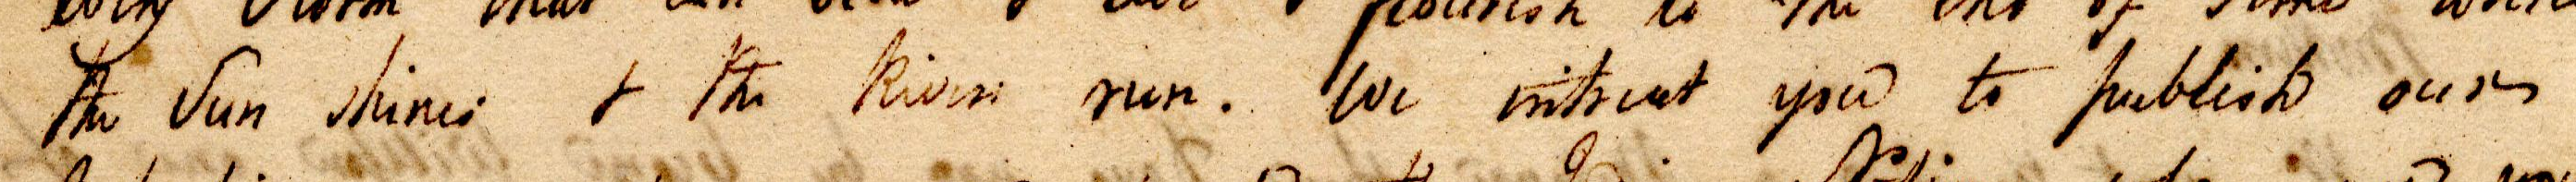the Sun shines & the Rivers run. We intreat you to publish our
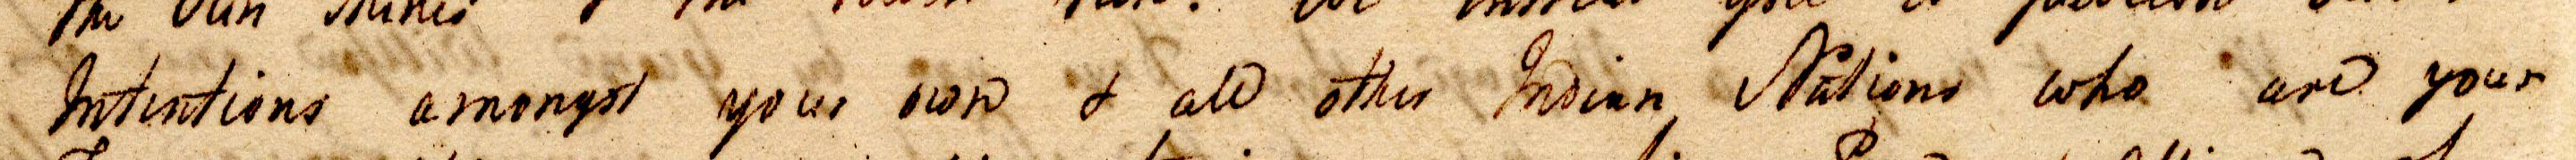Intentions amongst your own & all other Indian Nations who are your
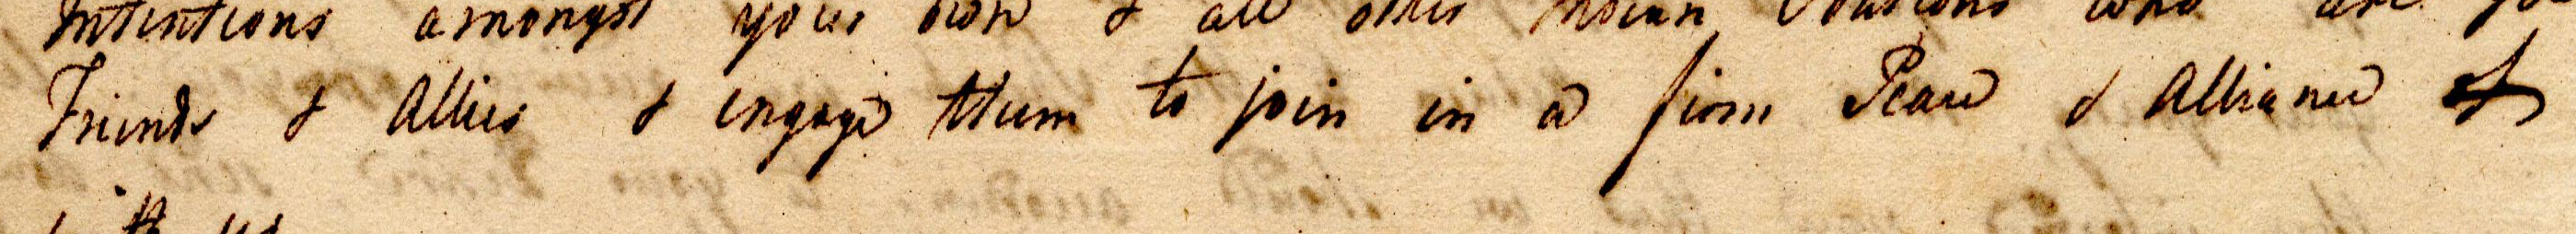Friends & allies & engage them to join in a firm Peace & Alliance of
